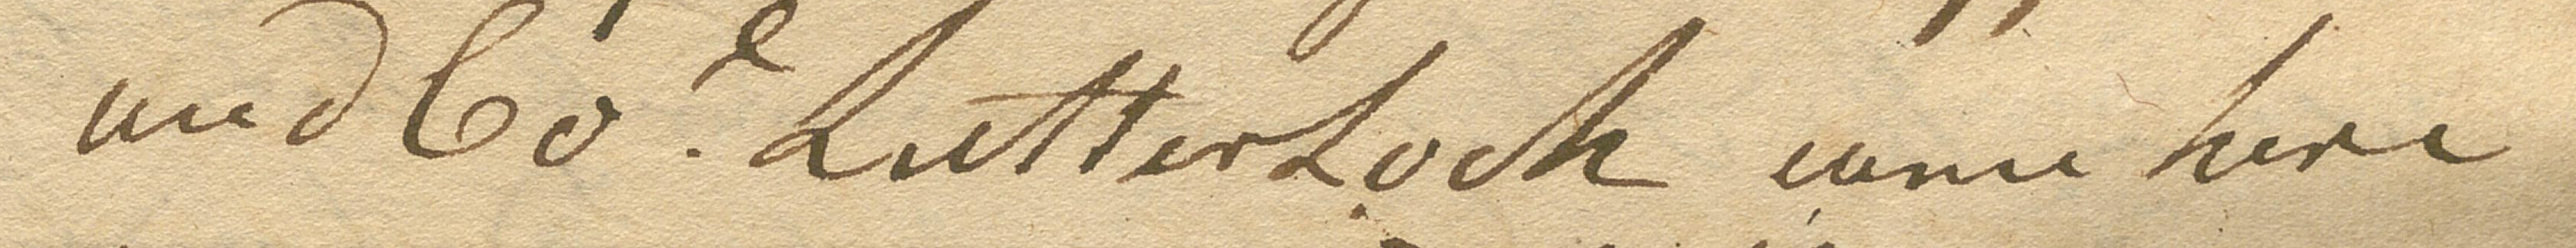and Co^l. Letterlock came here
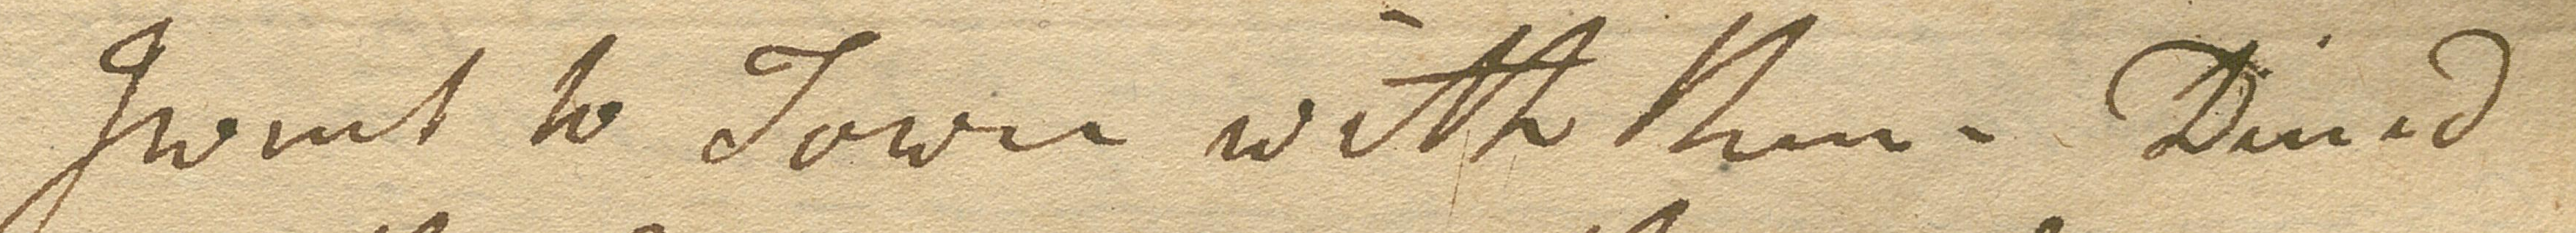I went to Town with then. Dined
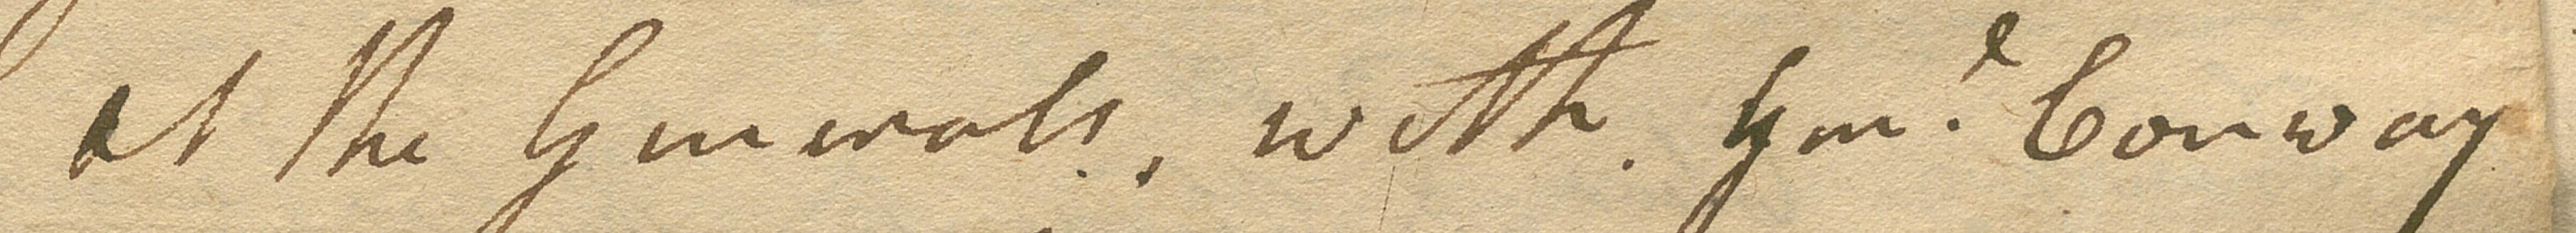at the Generals, with Gen^l. Conway
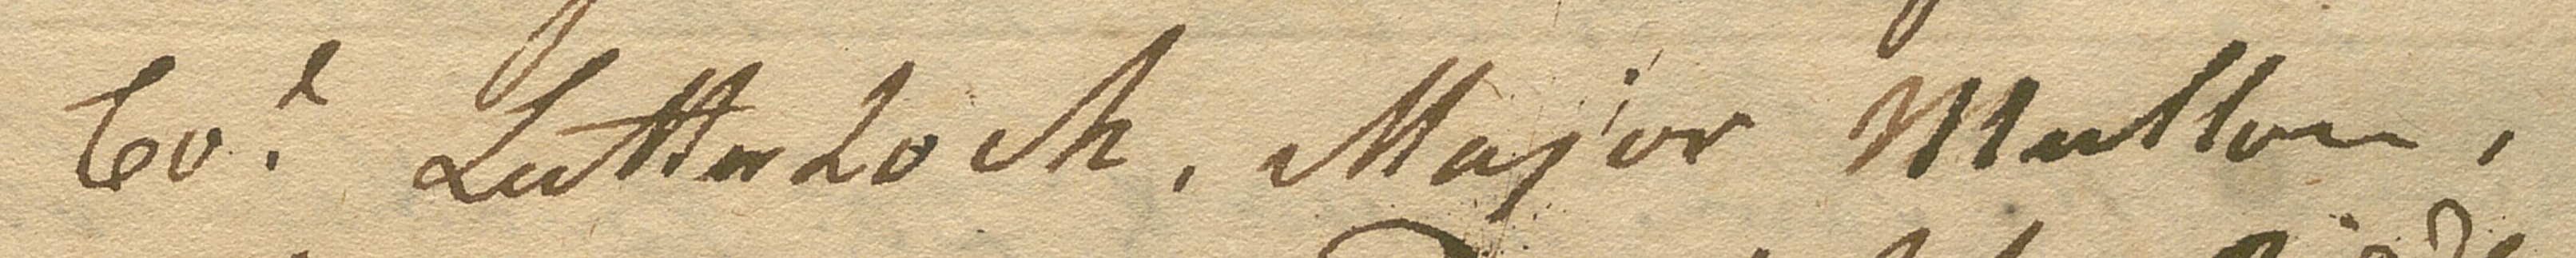Co^l. Letterlock, Major Mullon,
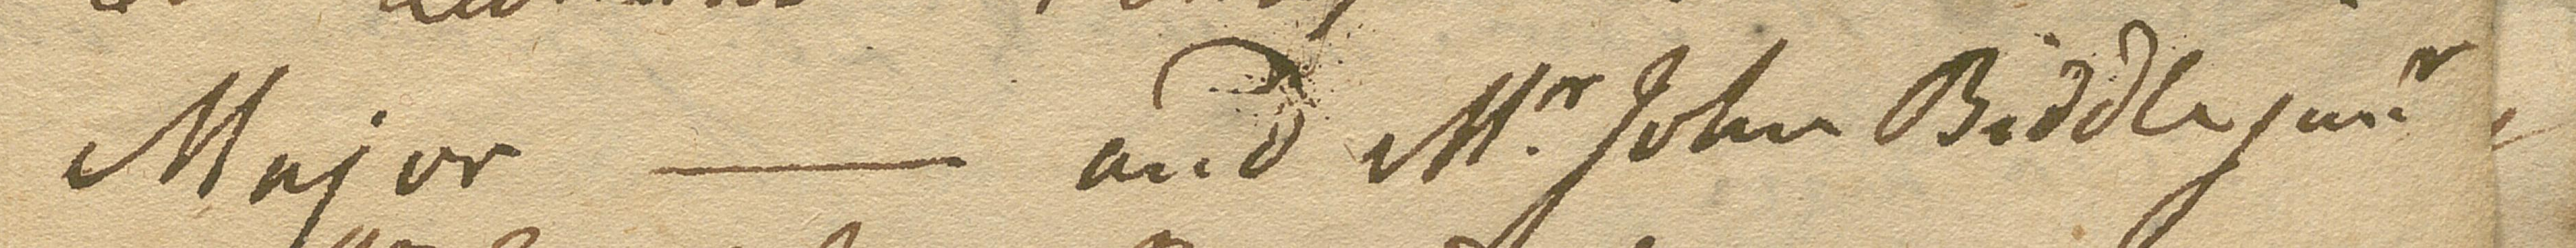Major- and M^r. John Biddle jun^r.
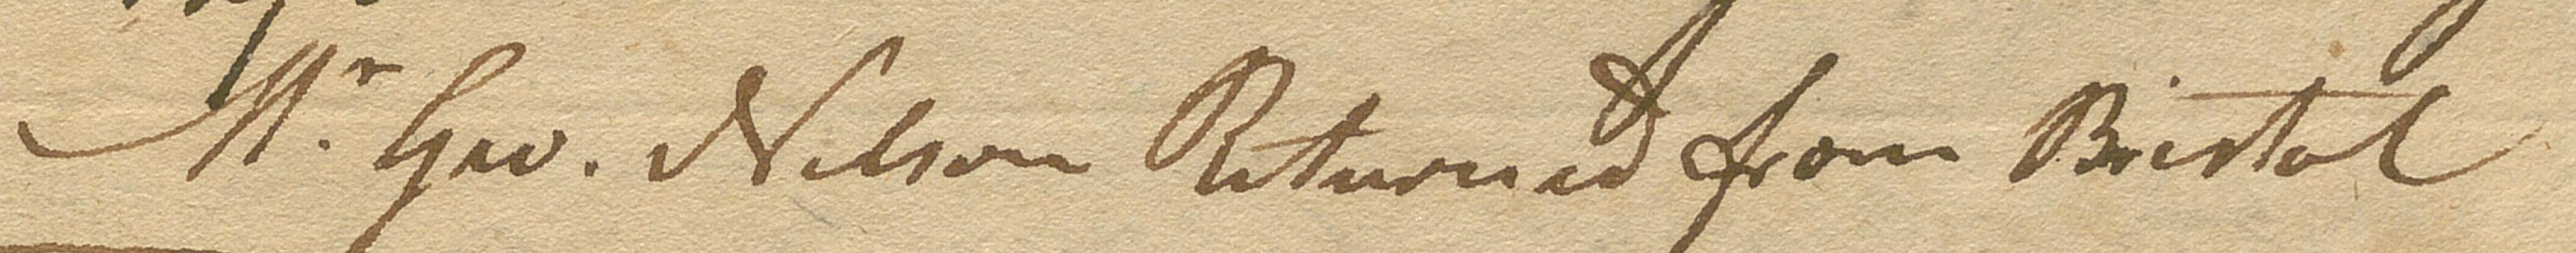M^r. Geo. Nelson Returned from Bristol
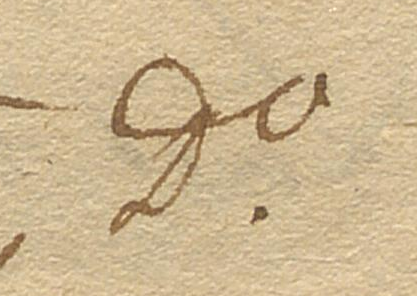D^o.
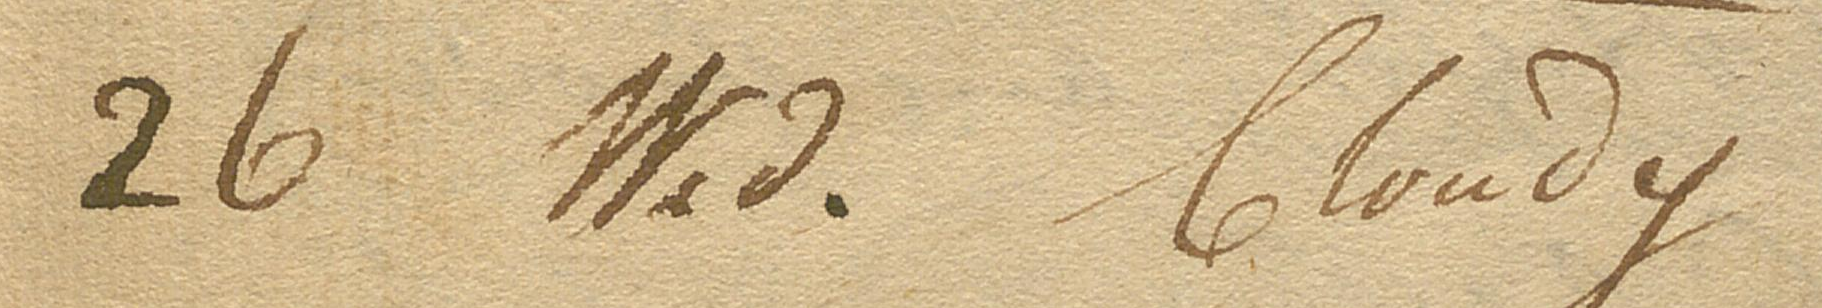26 Wed. Cloudy
